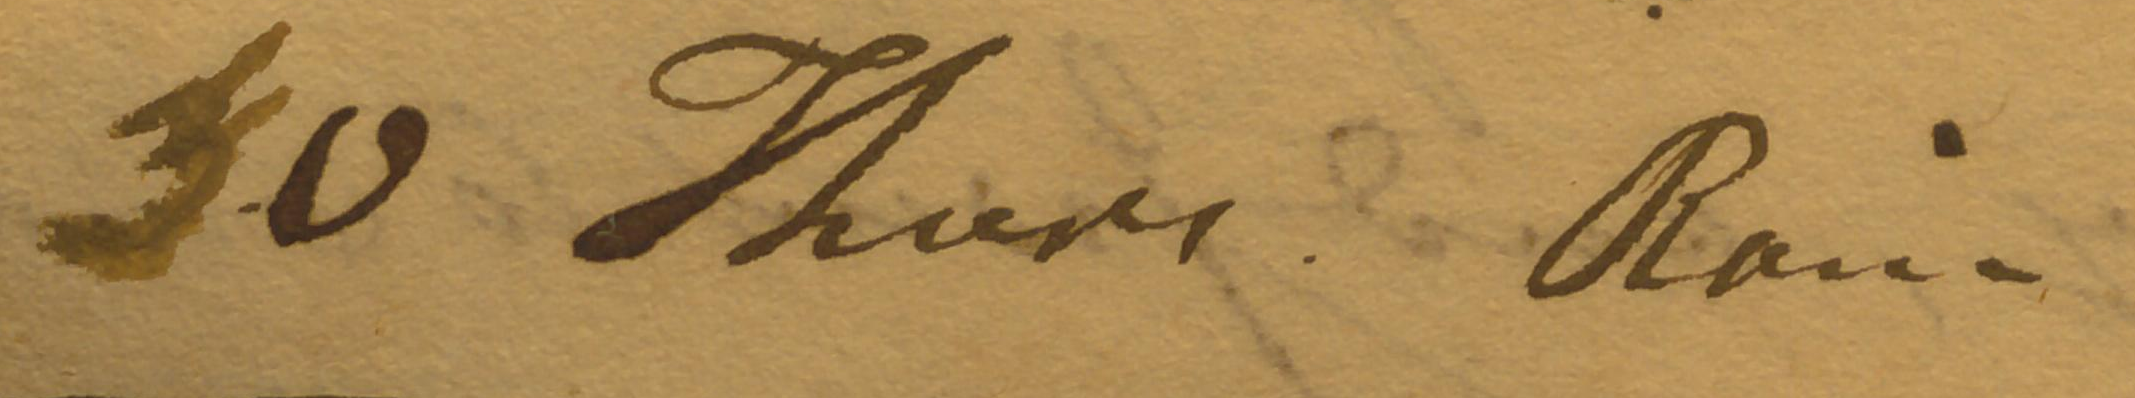30 Thurs. Rain
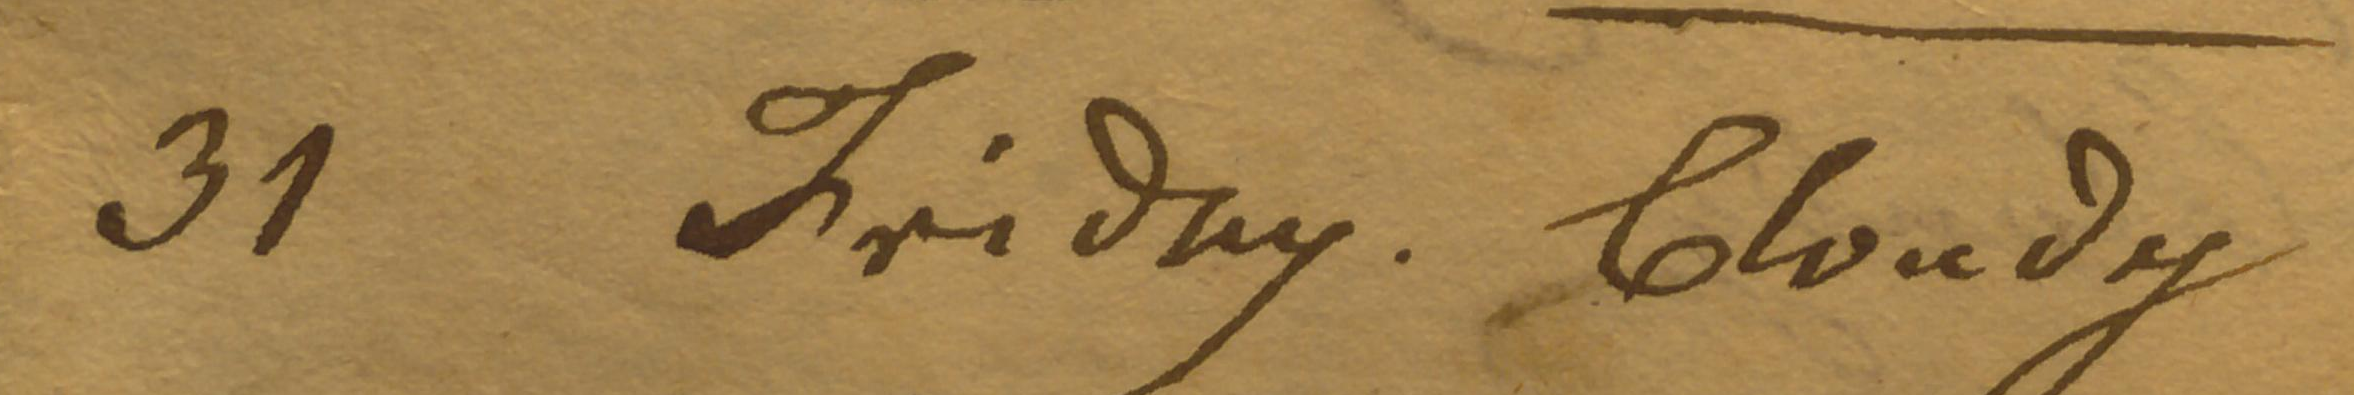31 Friday. Cloudy
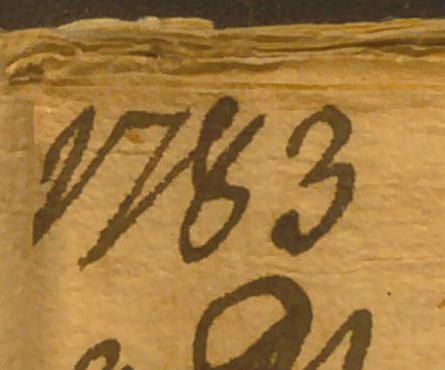1783
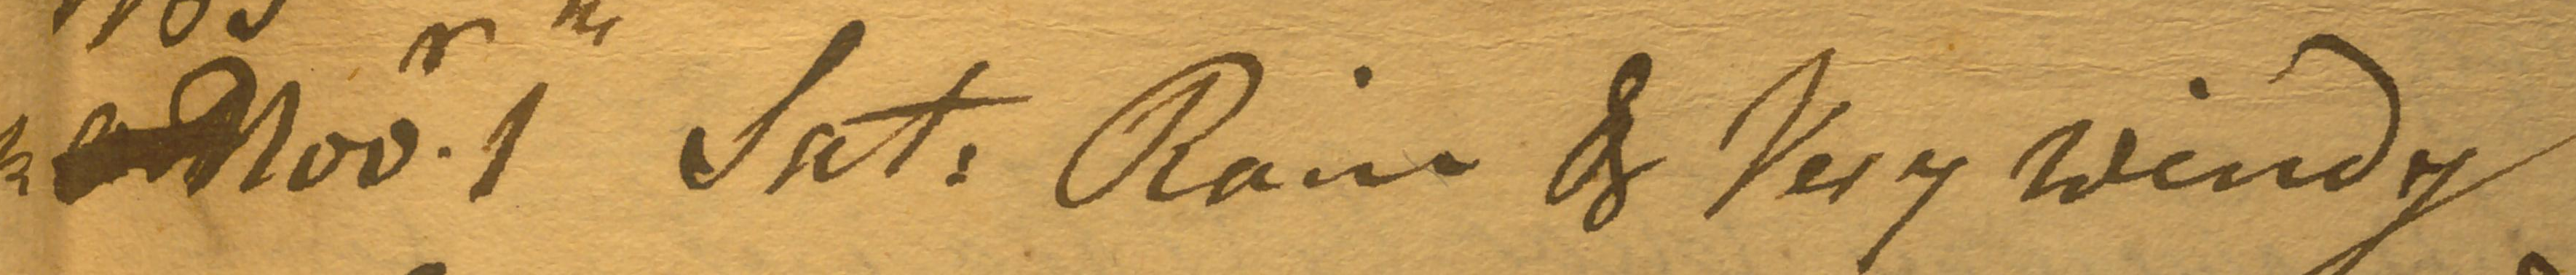Nov^r. 1^th Sat. Rain & Very windy
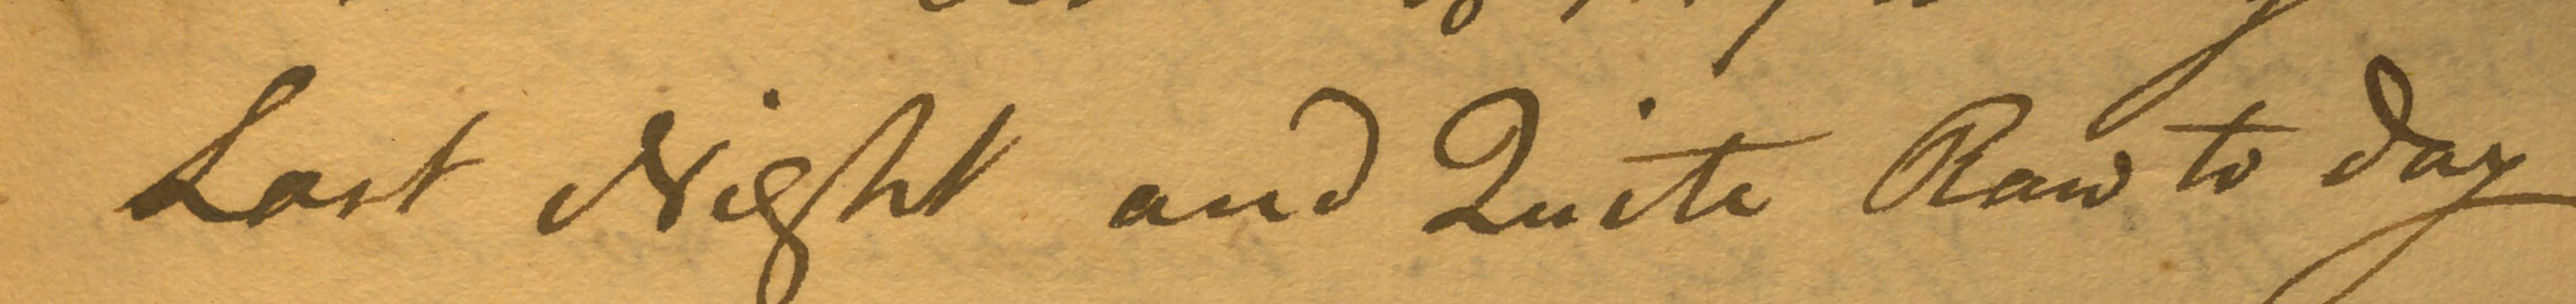Last Night and Quite Raw to day
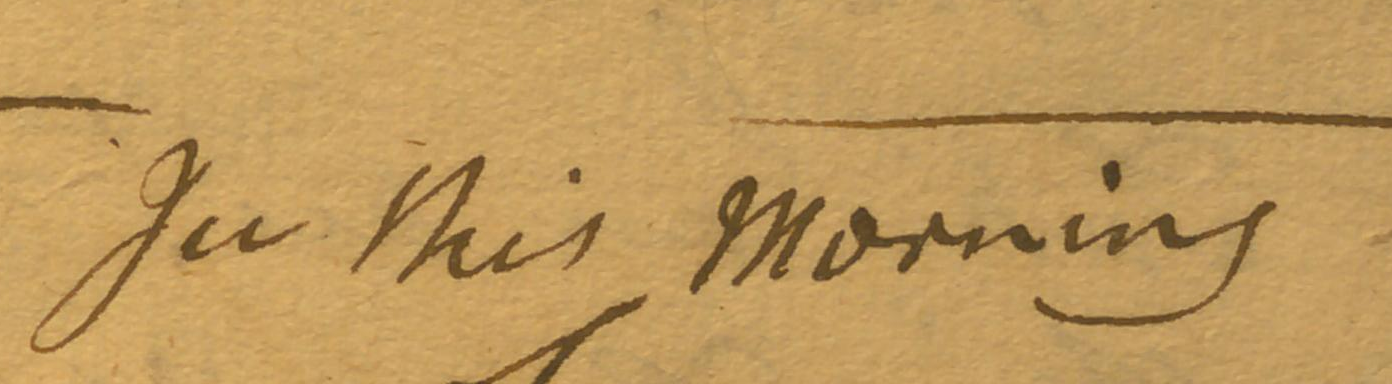Ice this Morning
